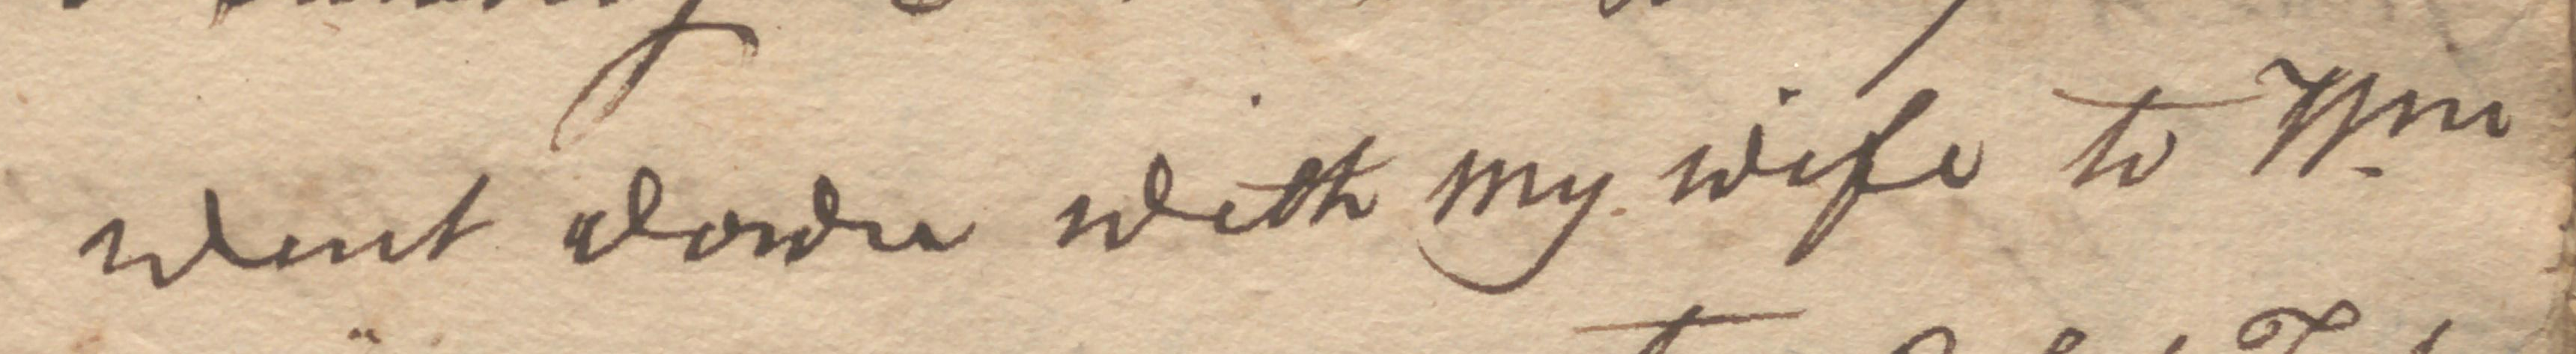went down with my wife to W^m.
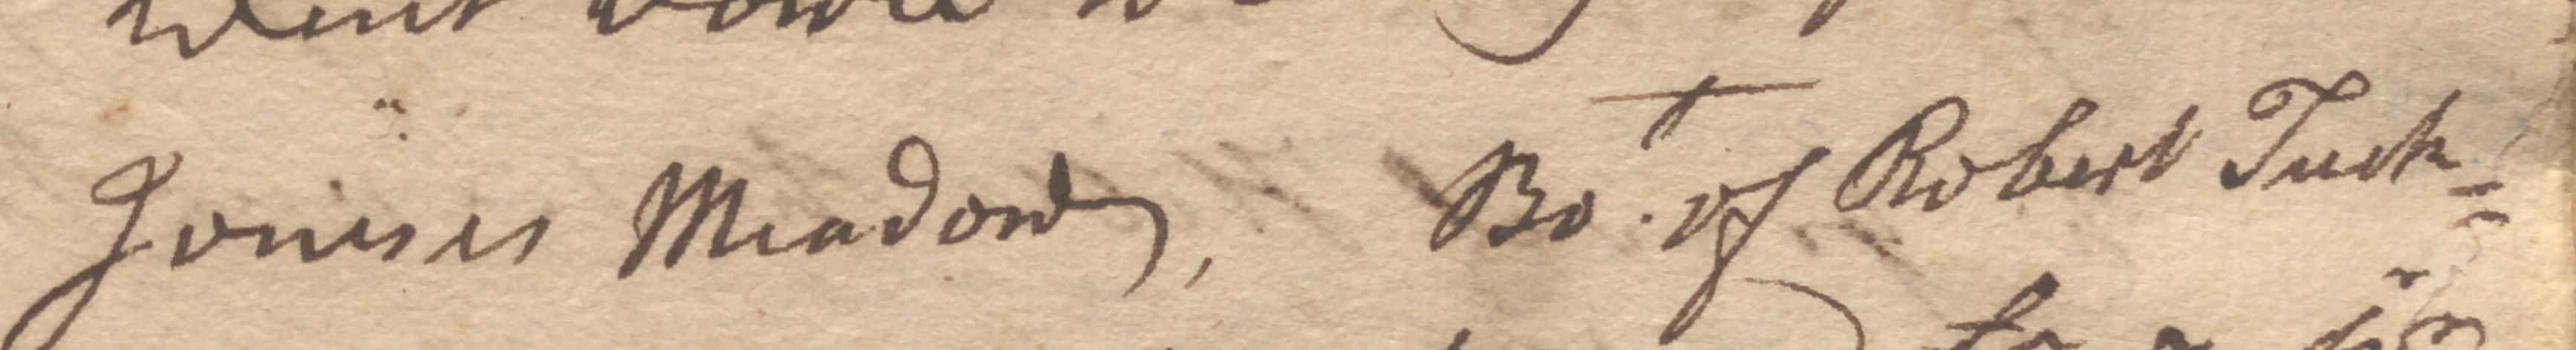Joneses Meadow, Bo^t. of Robert Tuck-
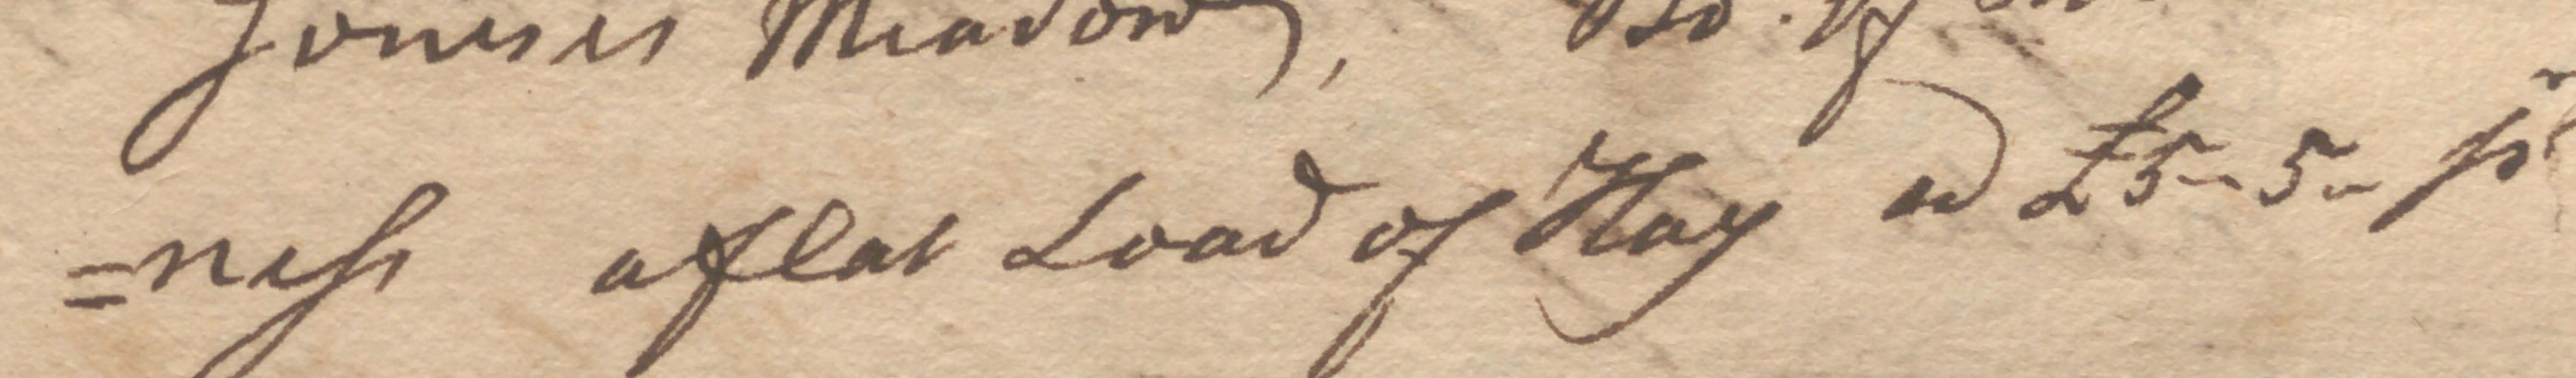-ness a flat Load of Hay @ £5.5. p^r.
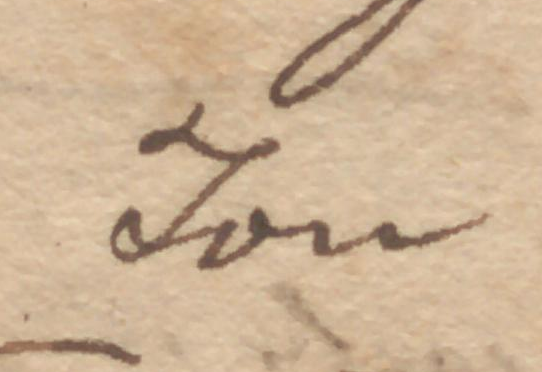Ton
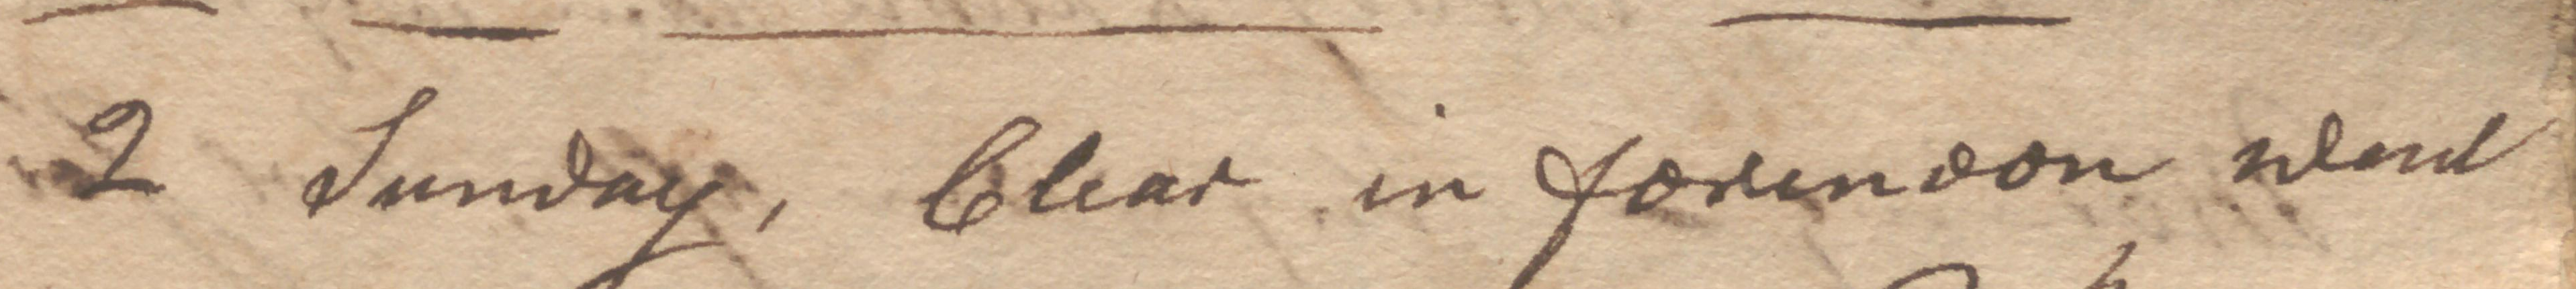2 Sunday, Clear in forenoon went
